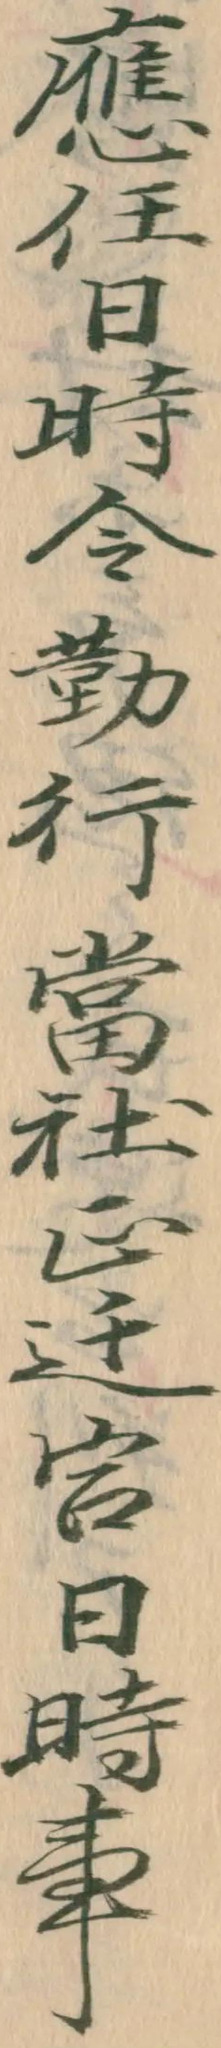応任日時令勤行当社正迁宮日時事
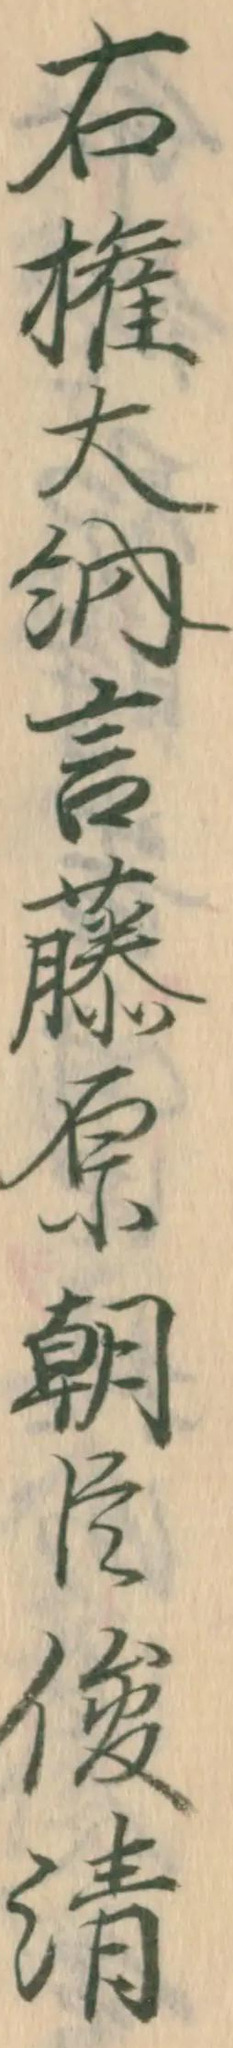右権大納言藤原朝臣俊清
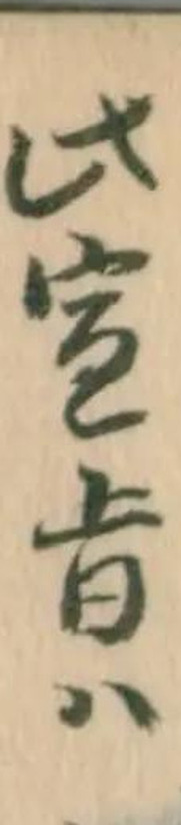此宣旨ハ
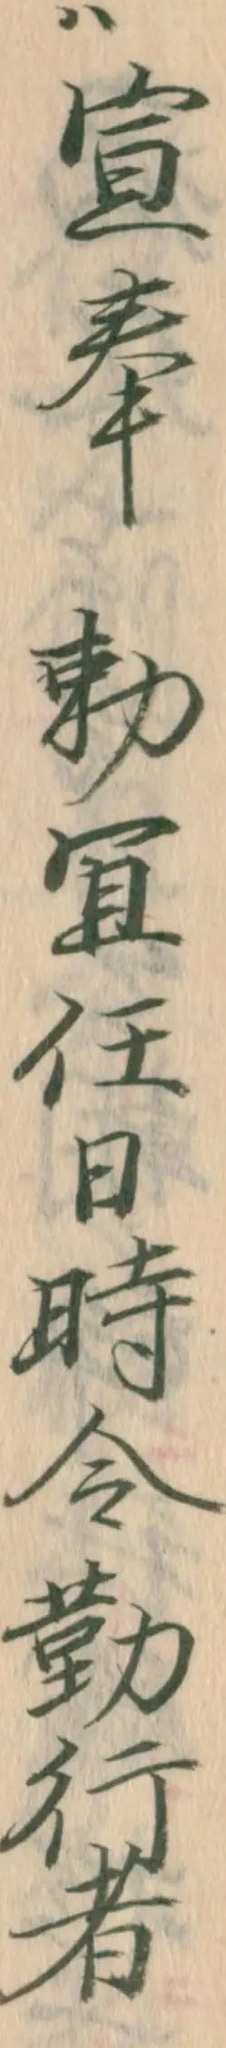宣奉勅宜任日時令勤行者
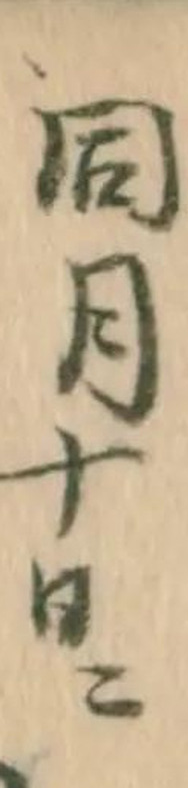同月十日ニ
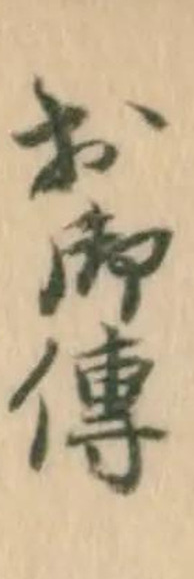於御伝
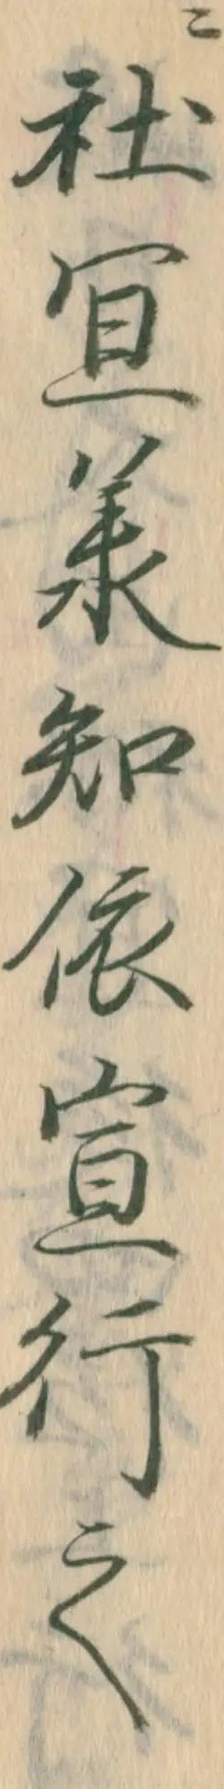社宜承知依宣行之
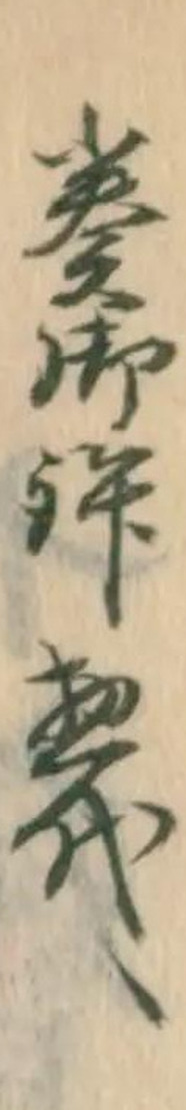奏御許惣代へ
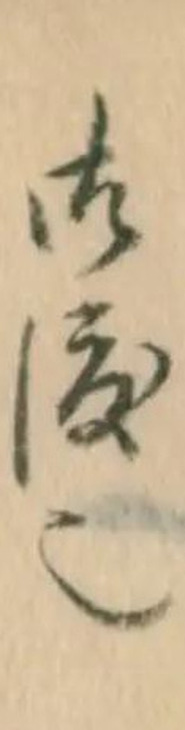御渡也
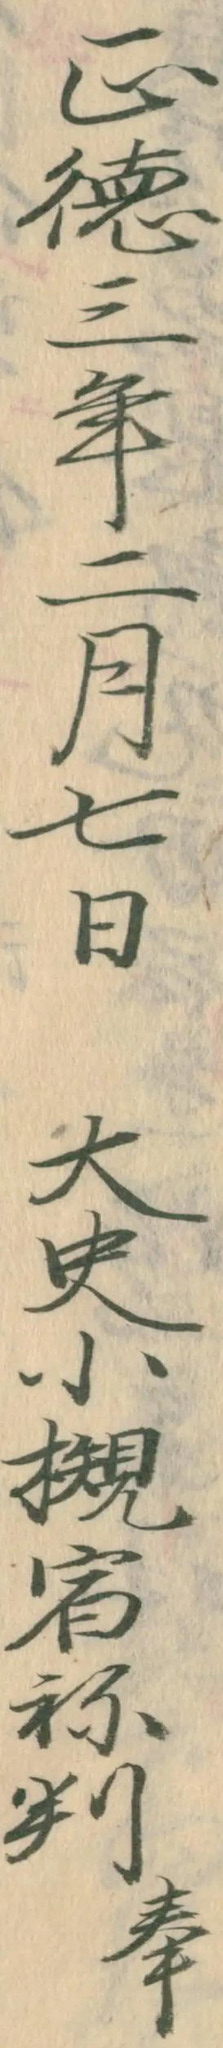正徳三年二月七日大史小槻宿祢判奉
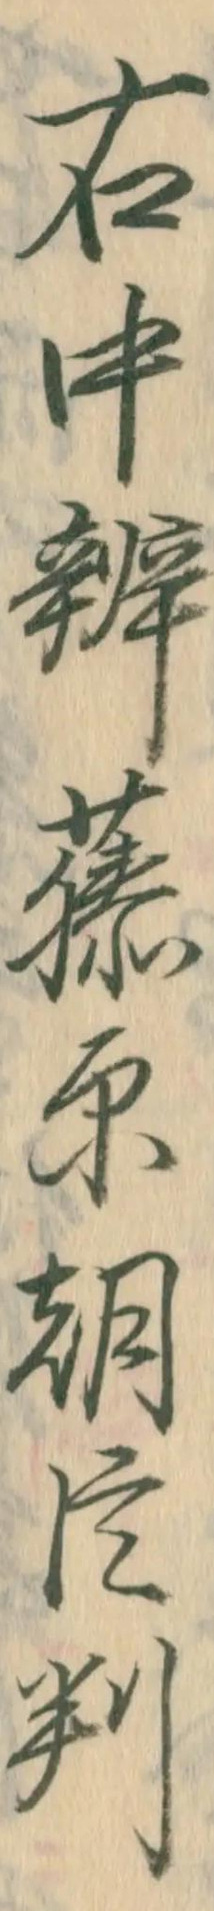右中弁藤原朝臣判

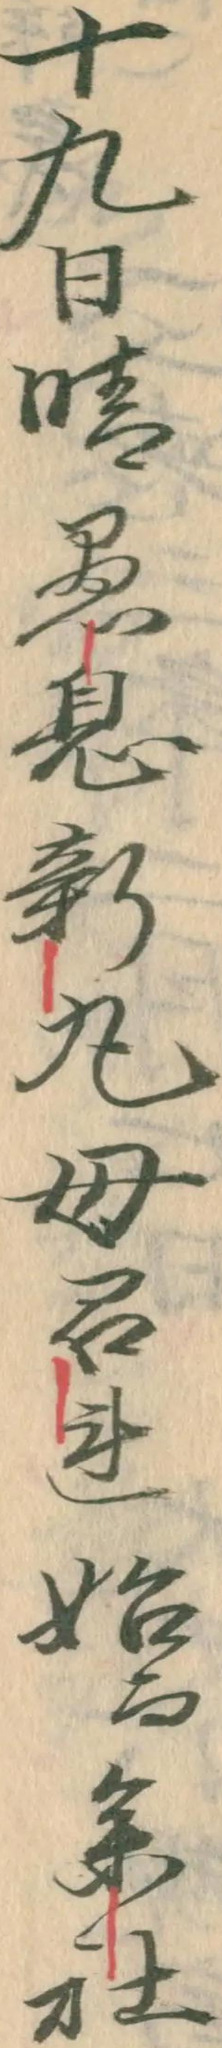十九日晴愚-息新_丸母召_連始而参-社
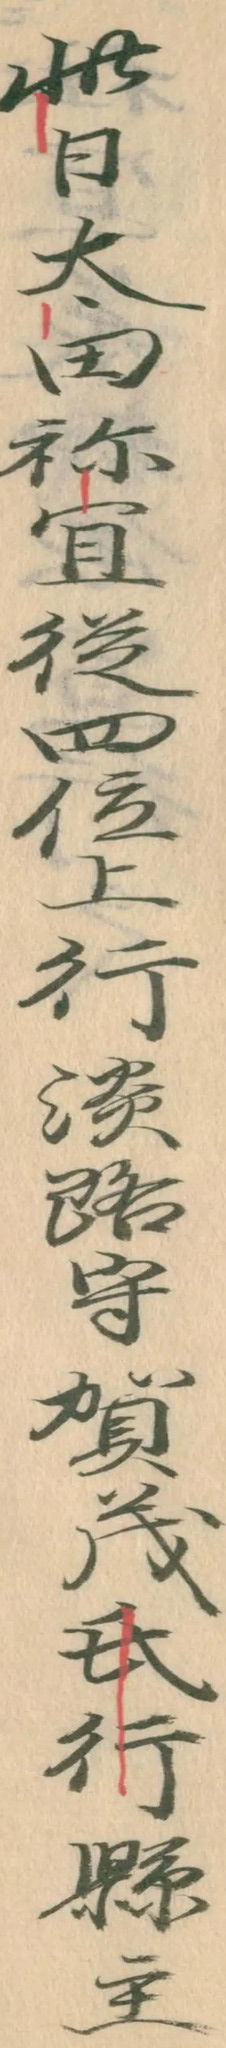此_日太_田祢-宜従四位上行淡路守賀茂氏行県主
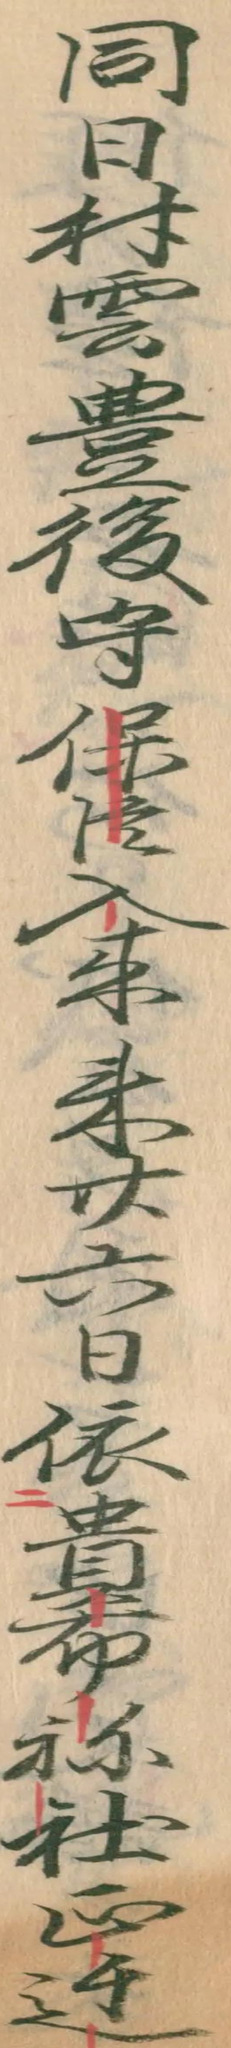同日村雲豊後守保臣入-来来廿六日依貴-布-祢_社正-迁-
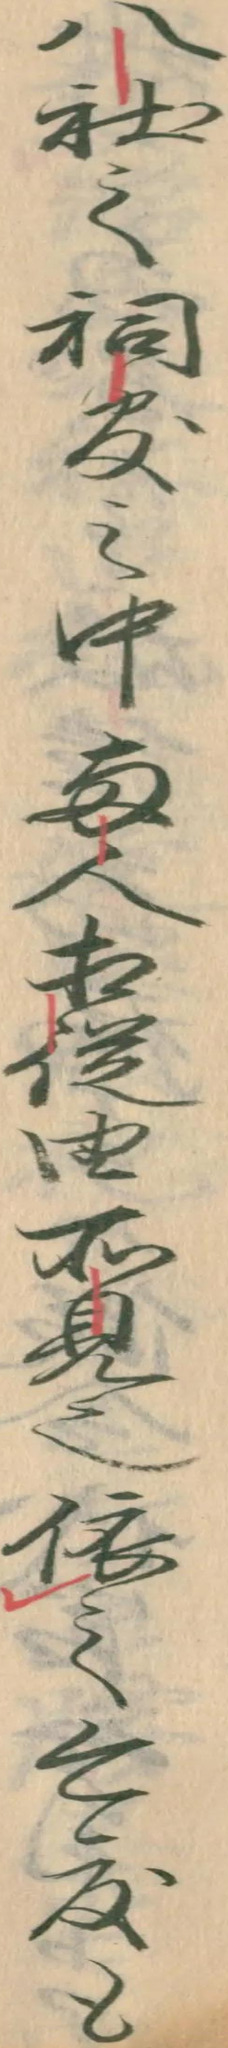八-社之祠-官之中両-人相_従由所-見也依之今度も
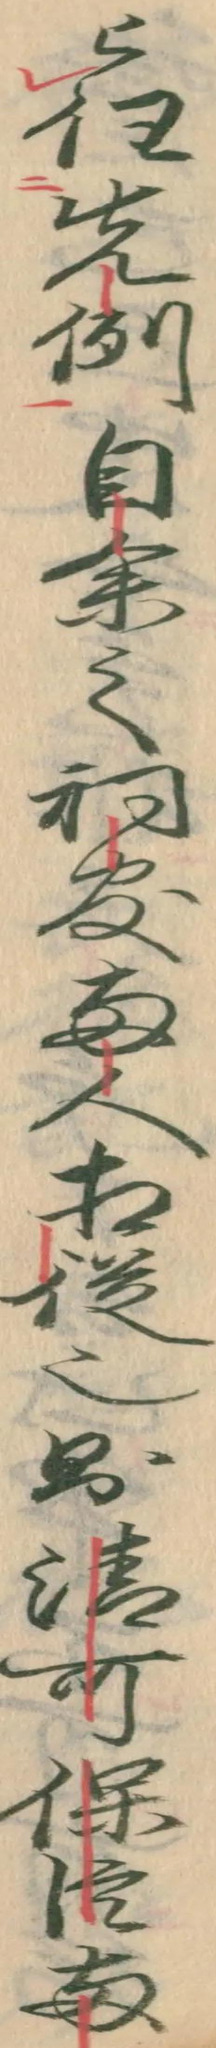被任先-例自-余之祠-官両-人相_従也則清可保臣両-
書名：賀茂社記録. 第16冊
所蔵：国立国会図書館 National Diet Library, JAPAN
